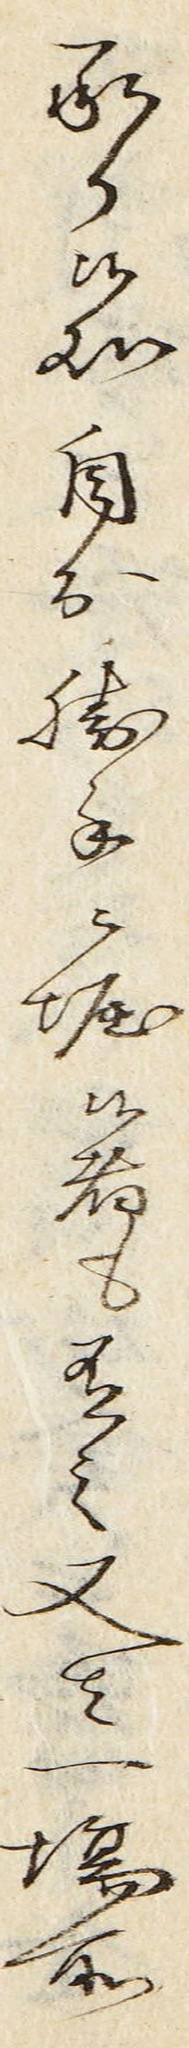承り候処自分勝手に堀候者も有之又は一場所
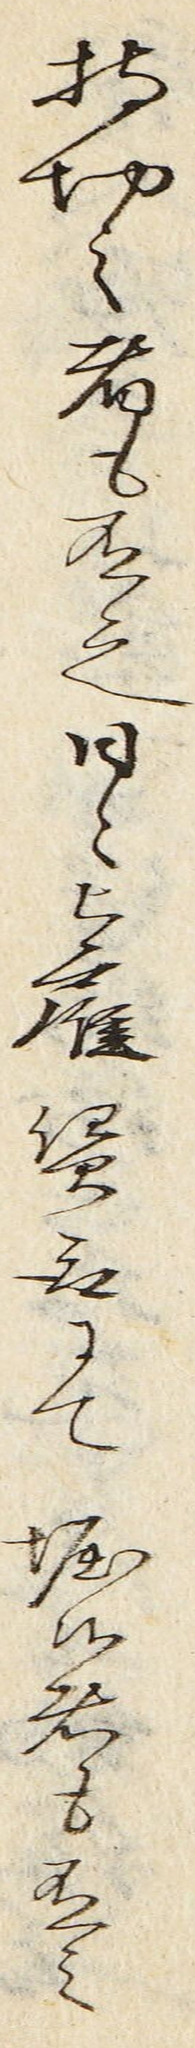持切之者も有之日々被雇賃取にて堀候者も有之
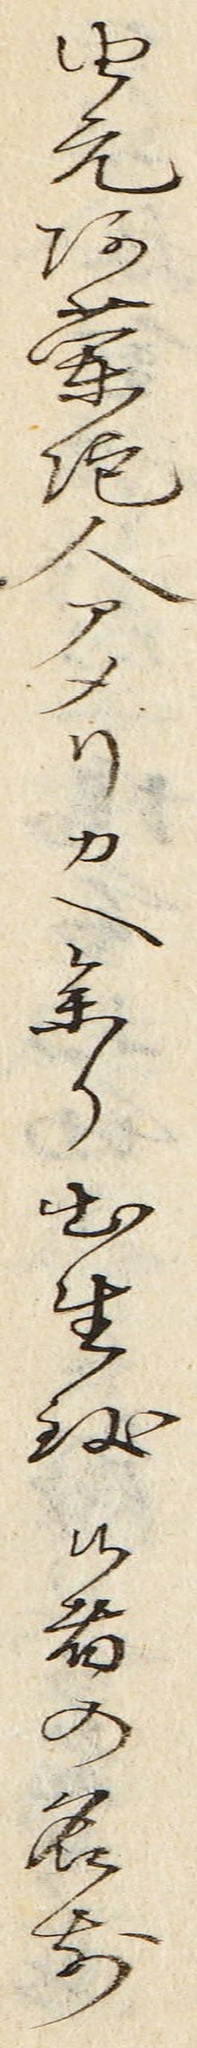由元阿蘭陀人アメリカへ参り出生致候者の名前

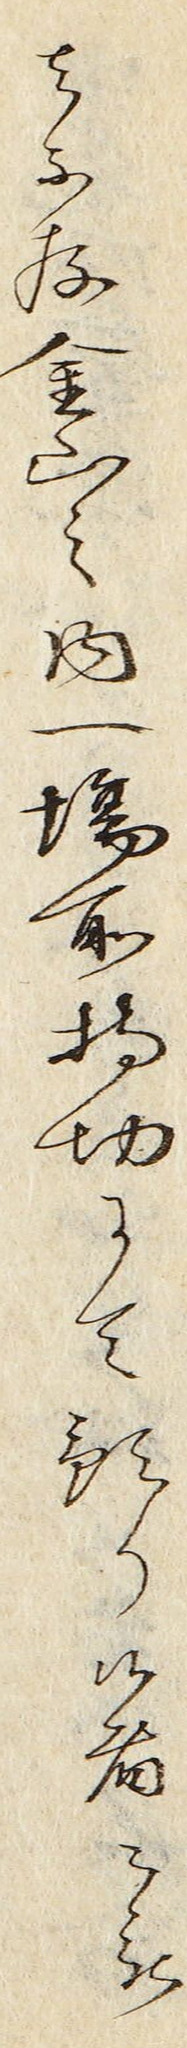は不及金山之内一場所持切にて預り候者に被
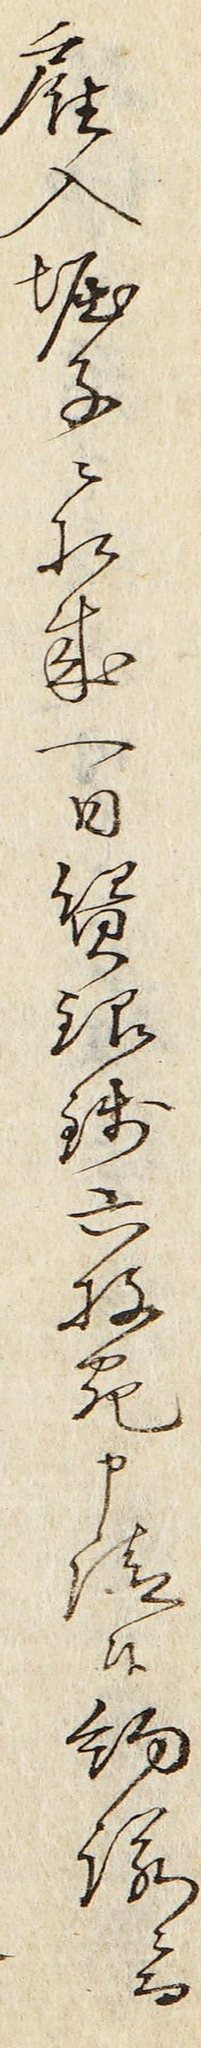雇入堀子に相成一日賃銀銭六枚宛申請候約諾に而
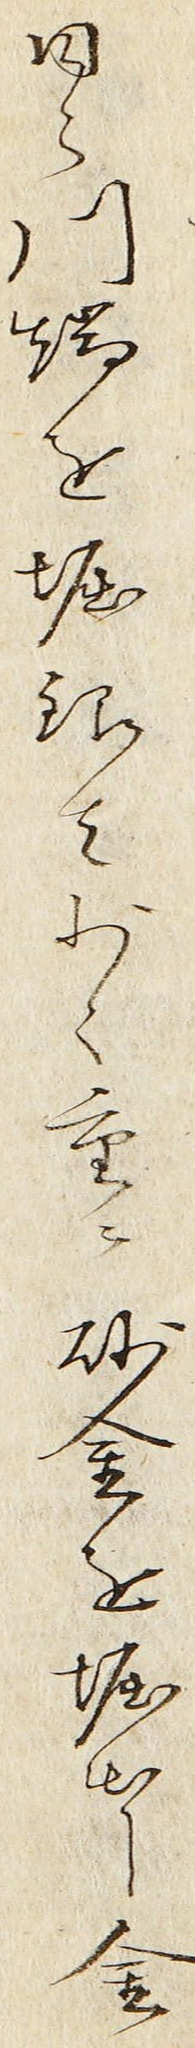日々川端を堀銀は少く重に砂金を堀出し金
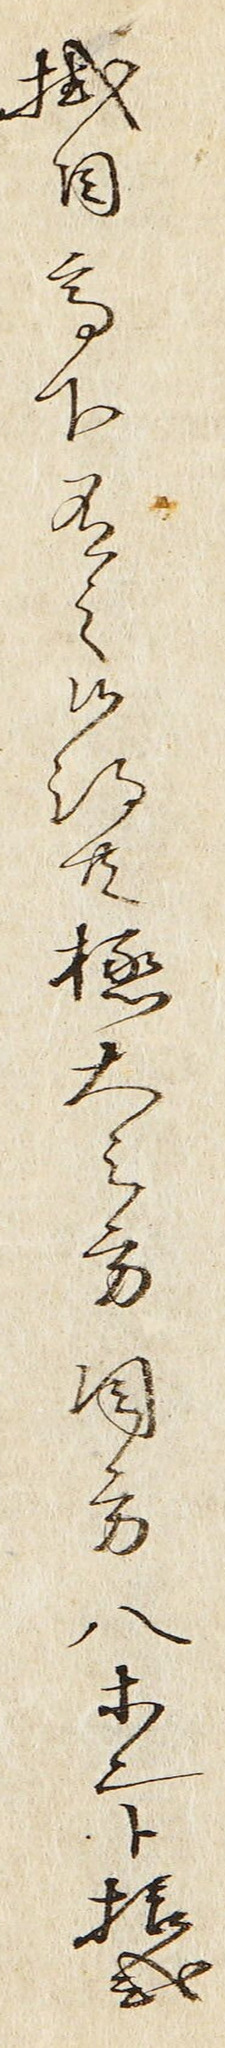掛目高下有之候得共極大之方目方八ホント拾弐
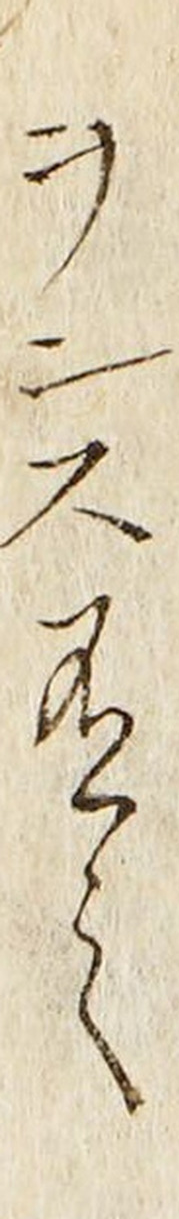ヲンス有之
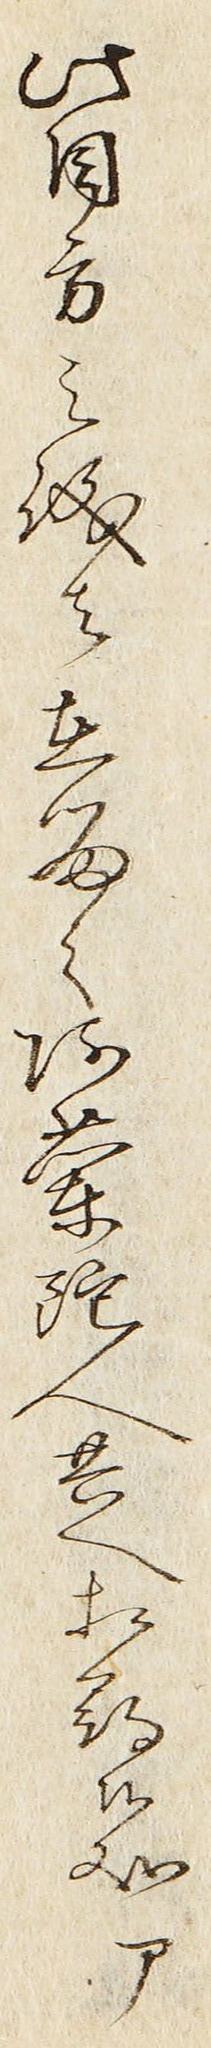此目方之儀は在留之阿蘭陀人共へ相尋候処ア
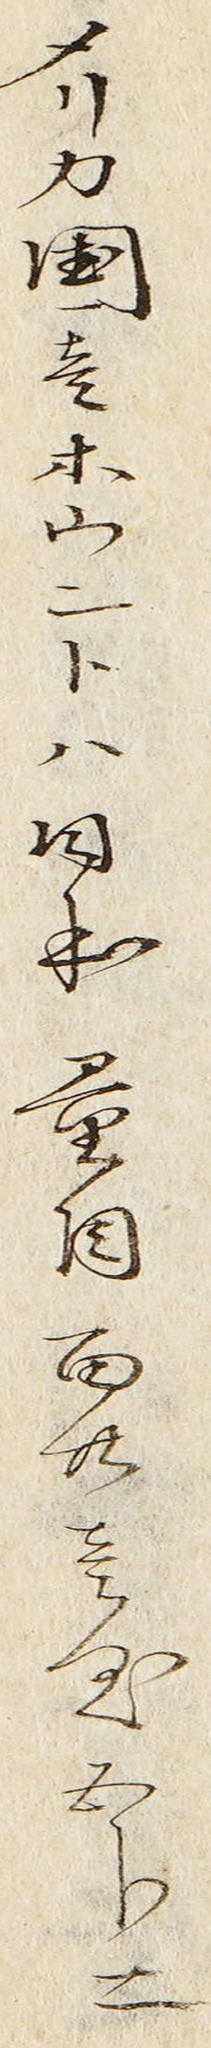メリカ国はホウントは日本量目百廿壱匁五分二
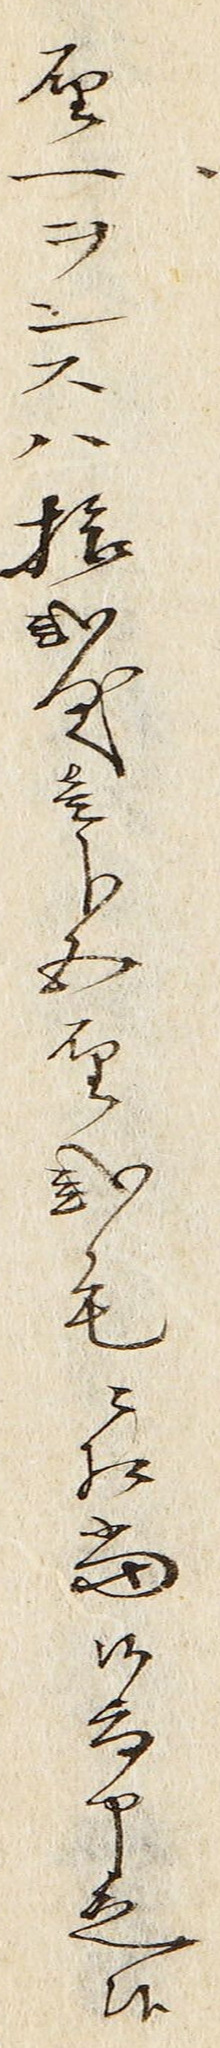厘一ヲンスは拾弐匁壱分五厘弐毛に相当候旨申立候
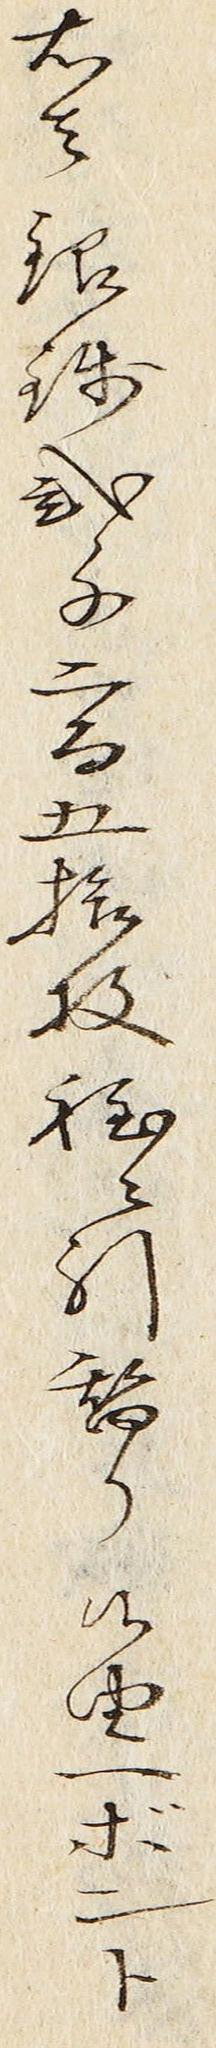右は銀銭弐千二百五拾枚程に引替り候由一ボント
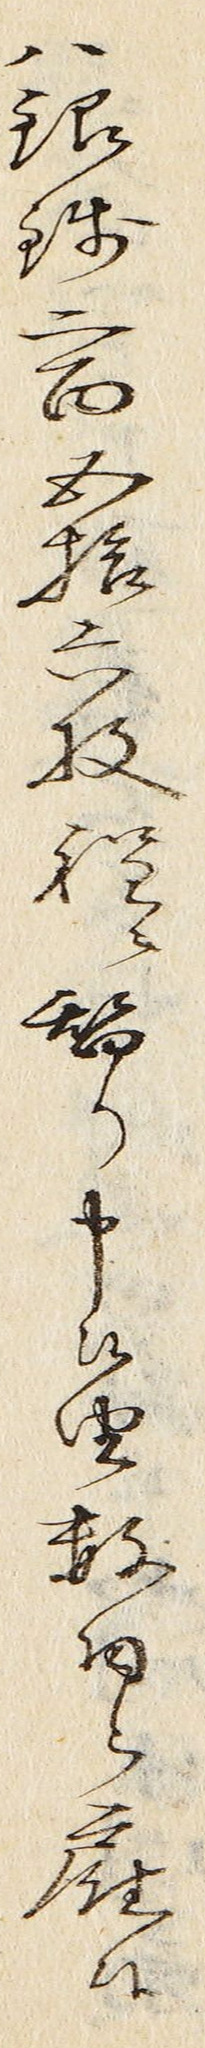は銀銭二百五拾六枚程に替り申候由数日被雇候
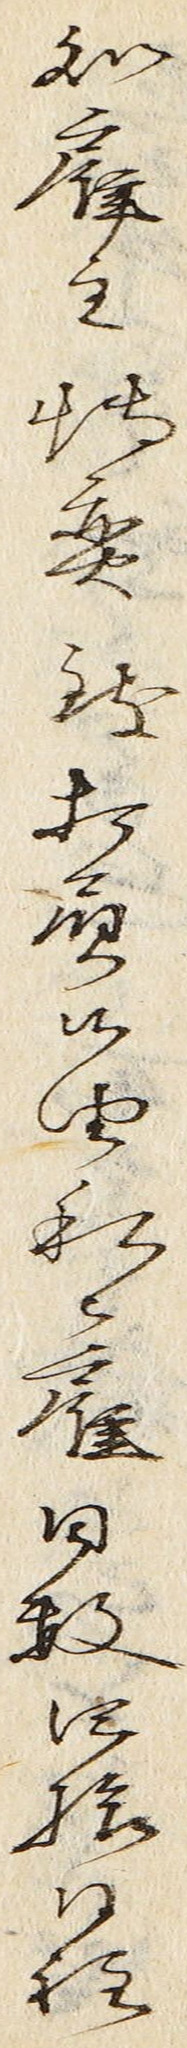処雇主博奕致相負候由私被雇日数四拾日程
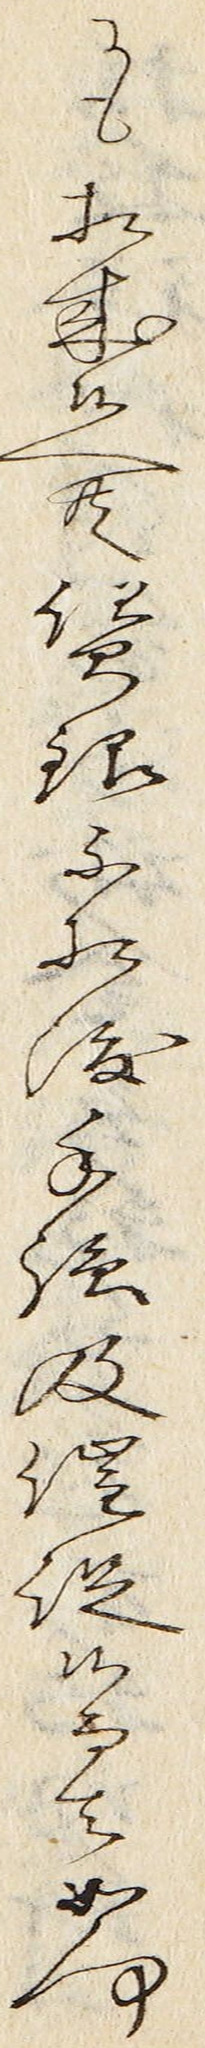にも相成候へ共賃銀不相渡手強及催促候而は如何
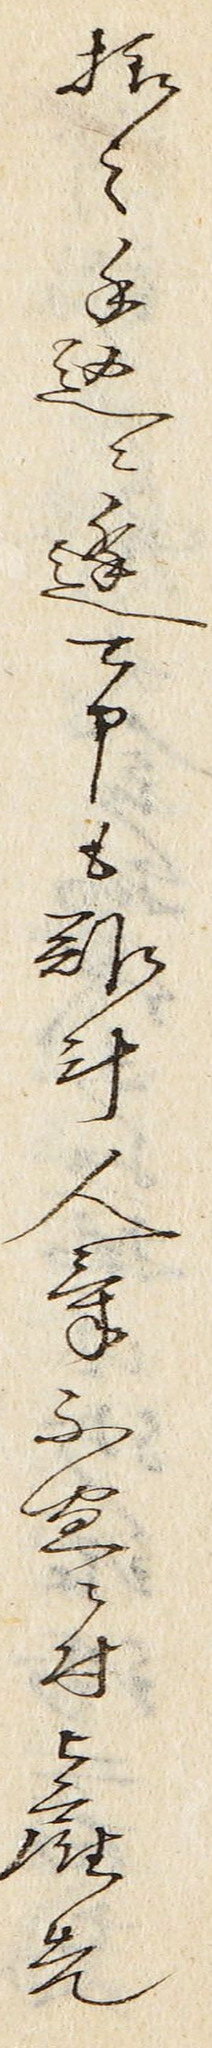様之手込に逢可申も難計人気不宜に付被雇先
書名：土佐中浜万次郎漂流記
